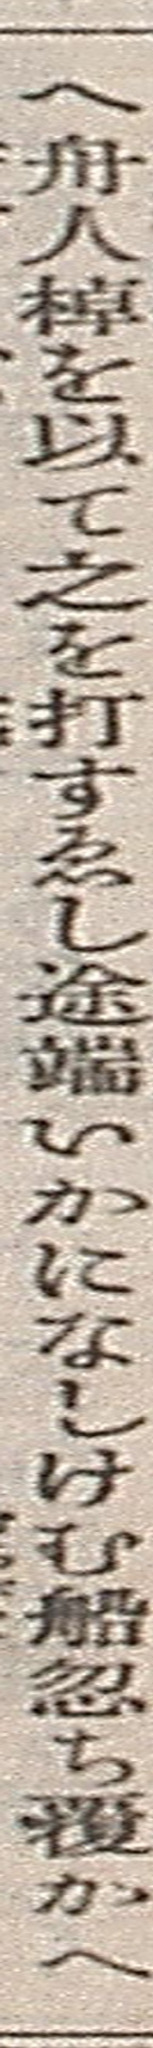へ船人棹を以て之を打すゑし途端いかになしけむ船忽ち覆かへ
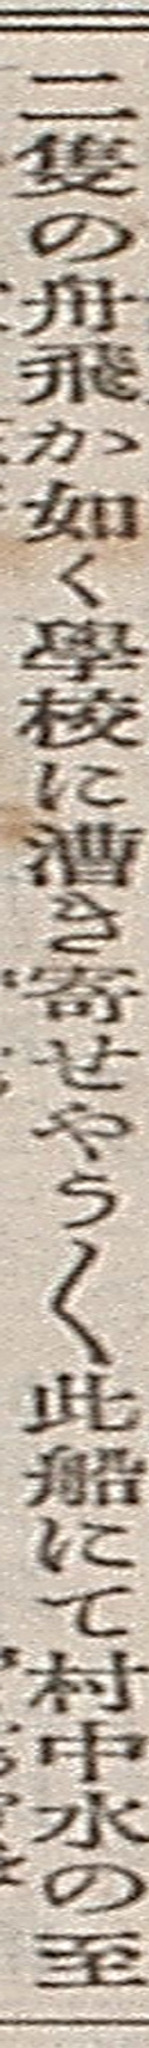二隻の舟飛か如く学校に漕ぎ寄せやう〳〵此船にて村中水の至
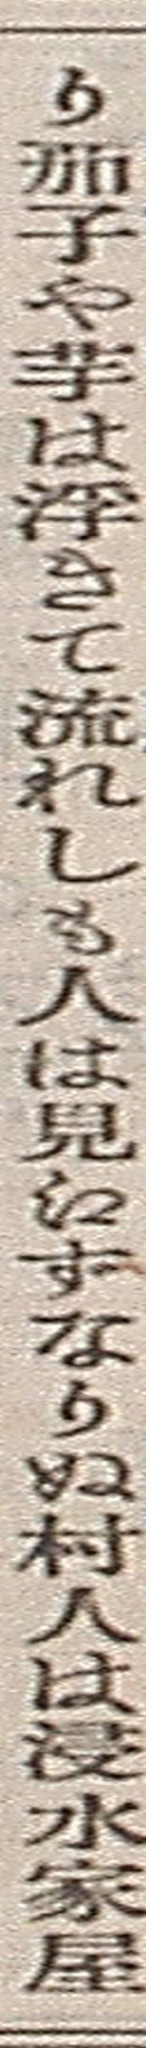り茄子や芋は浮きて流れしも人は見えずなりぬ村人は浸水家屋
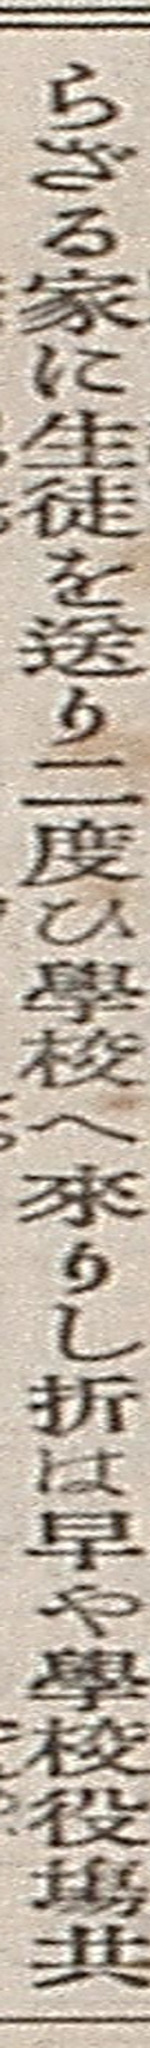らざる家に生徒を送り二度ひ学校へ来りし折は早や学校役場共
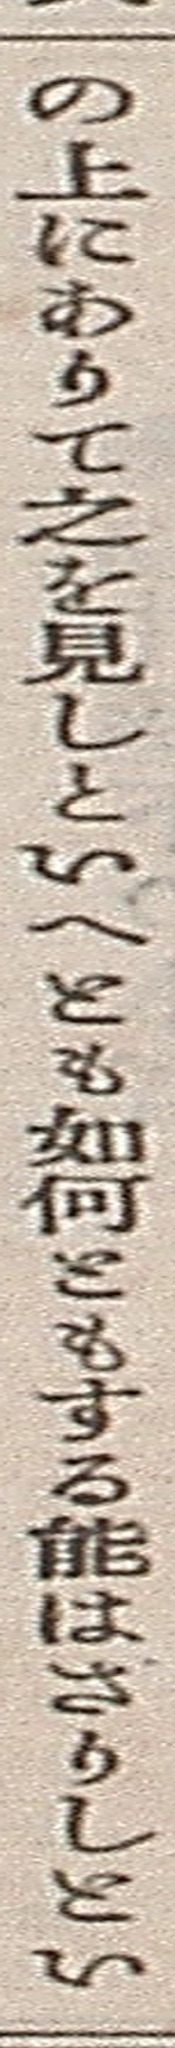の上にありて之を見しといへとも如何とするも能はさりしとい
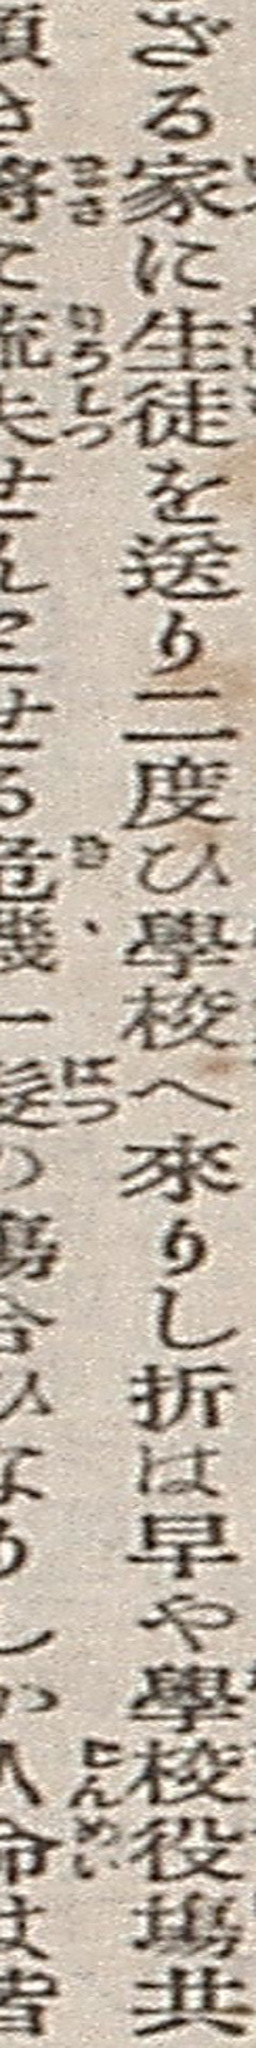に傾き将に流失せんとせる危機一髪の場合ひなりしか人命は皆
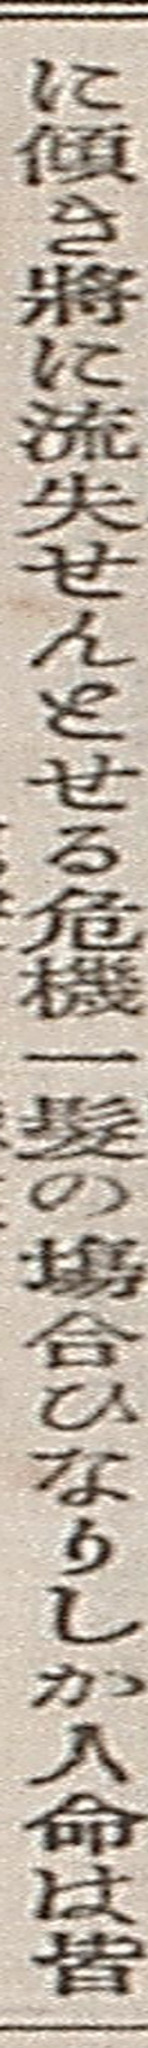に傾き将に流失せんとせる危機一髪の場合ひなりしか人命は皆
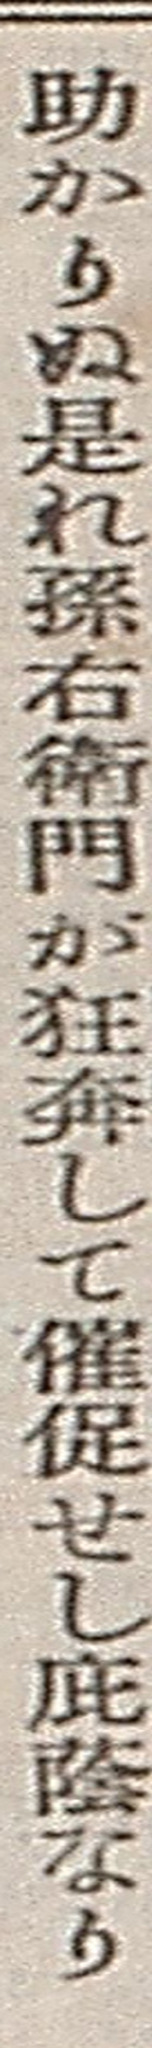助かりぬ是れ孫右衛門が狂奔して催促せし庇蔭なり
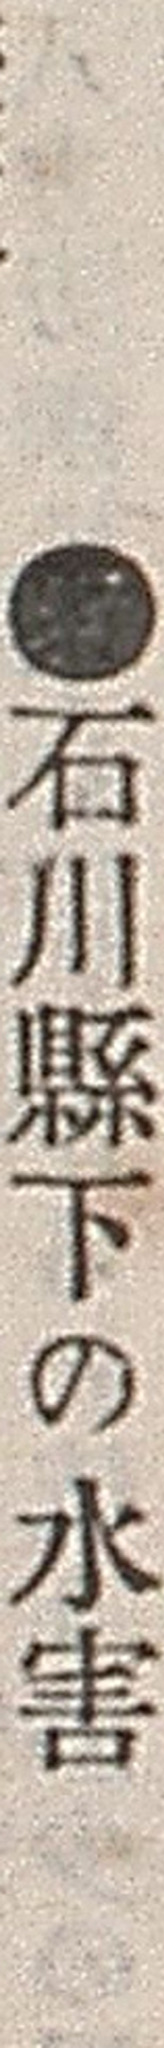●石川県下の水害
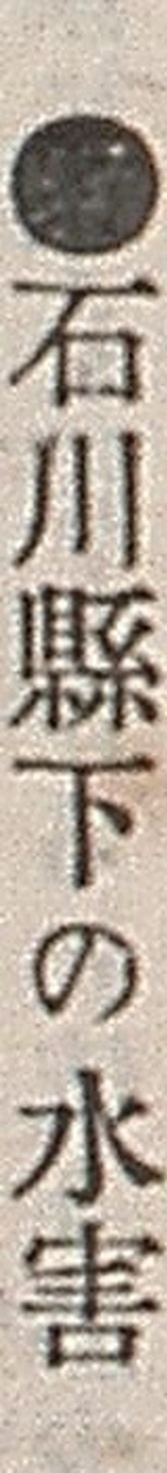●石川県下の水害
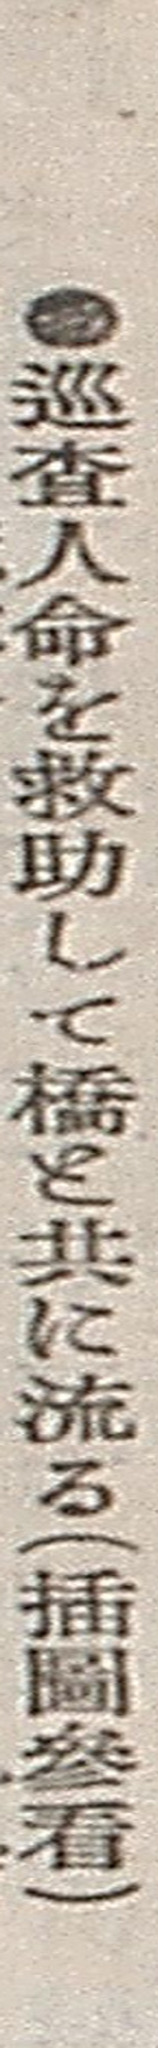●巡査人命救助して橋と共に流る
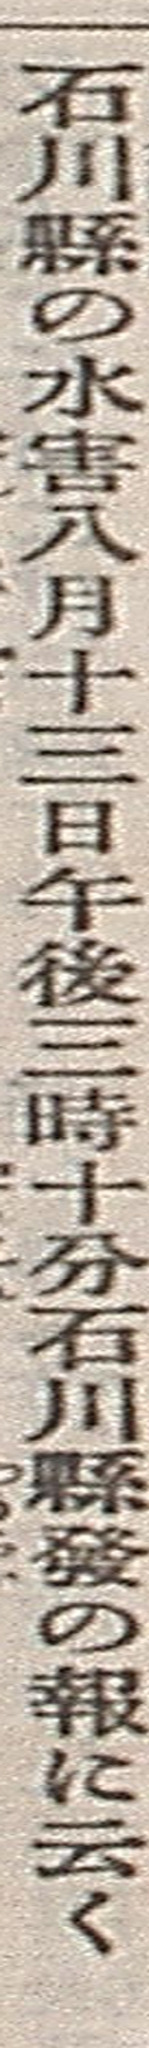石川県の水害八月十三日午後三時十分石川県発の報に云く
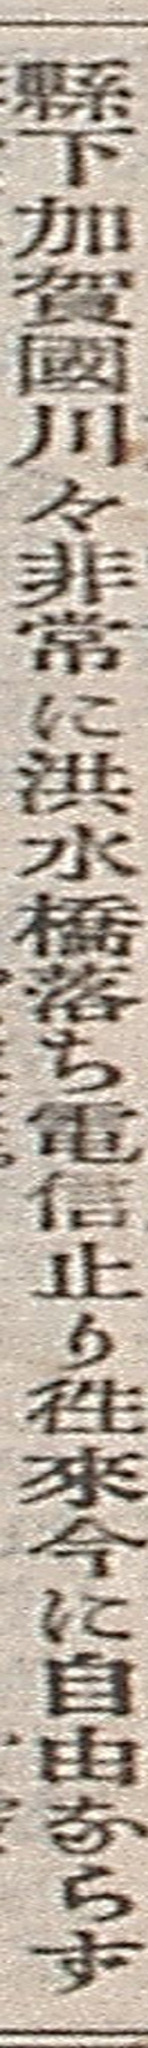県下加賀国川々非常に洪水橋落ち電信止り往来今に自由ならず
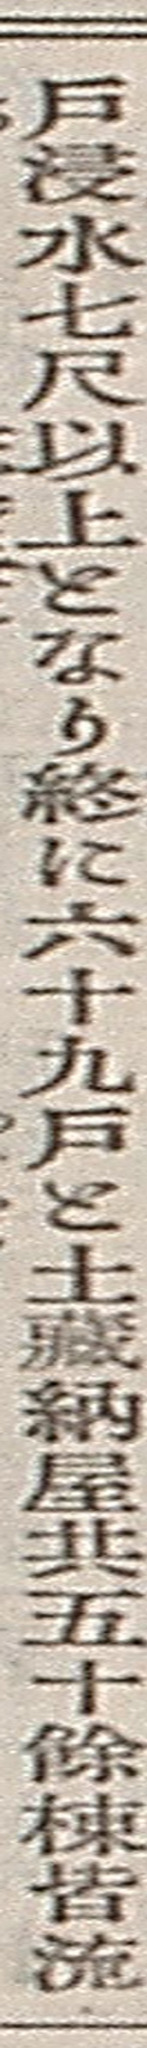戸浸水七尺以上となり終に六十九戸と土蔵納屋共五十餘棟皆流
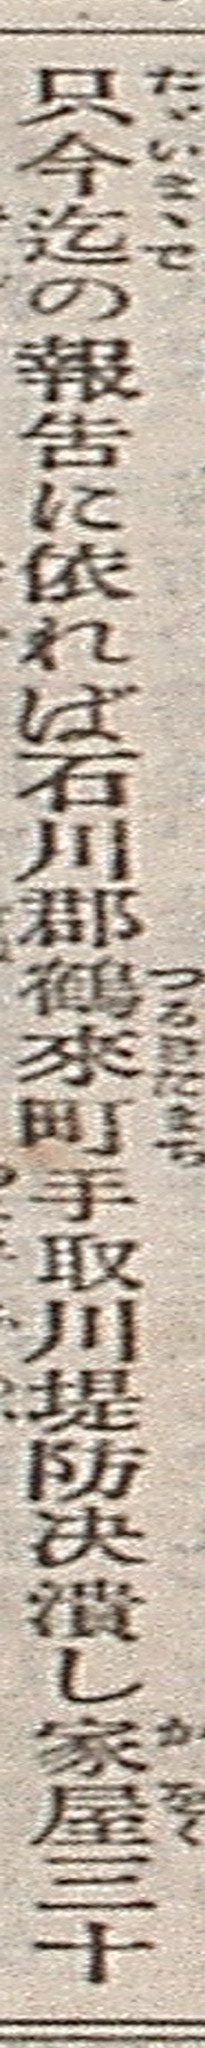只今迄の報告に依れば石川郡鶴来町手取川堤防决潰し家屋三十
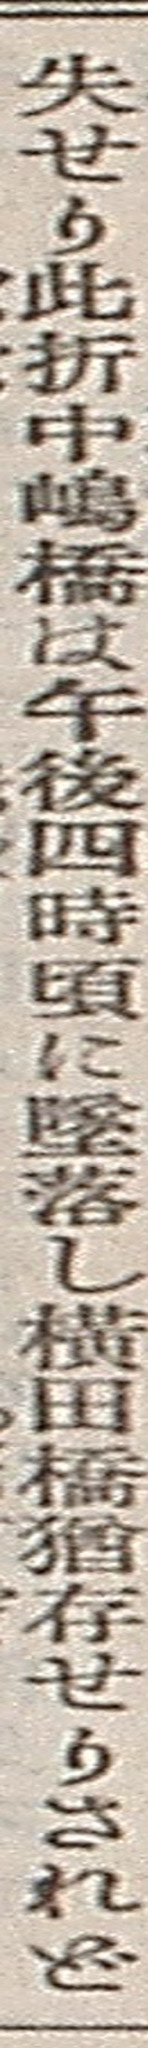失せり此折中嶋橋は午後四時頃に墜落し横田橋猶存せりされど
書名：風俗畫報臨時増刊第百二十八號　洪水被害録（下）
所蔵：東京大学地震研究所図書室 Earthquake Research Institute Library, The University of Tokyo, JAPAN
